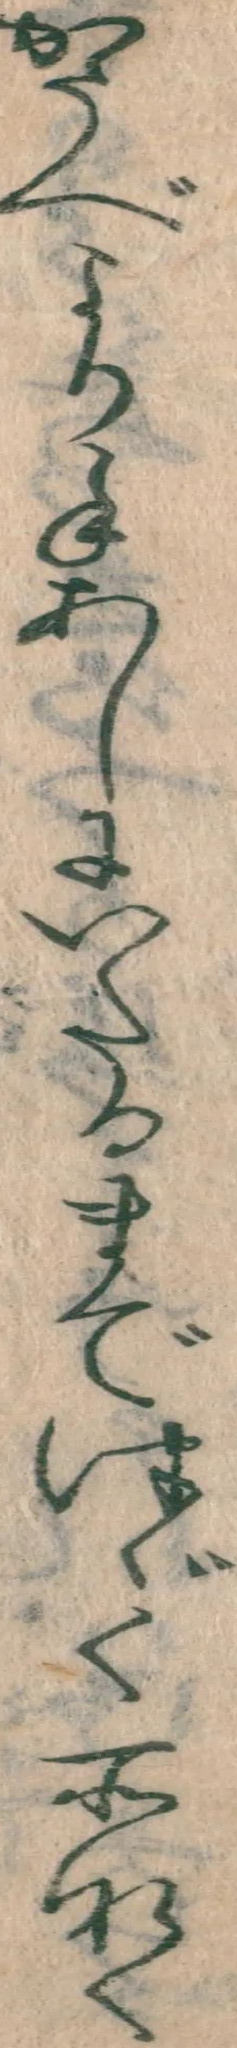かうべより手あしにいたるまでつゞく所なく
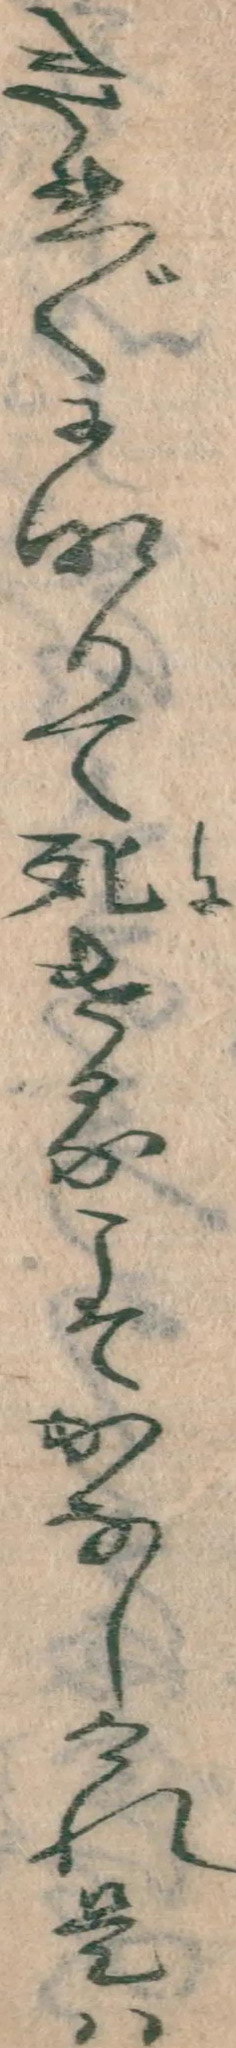きれ〴〵になりて死けるこそかなしけれ是は
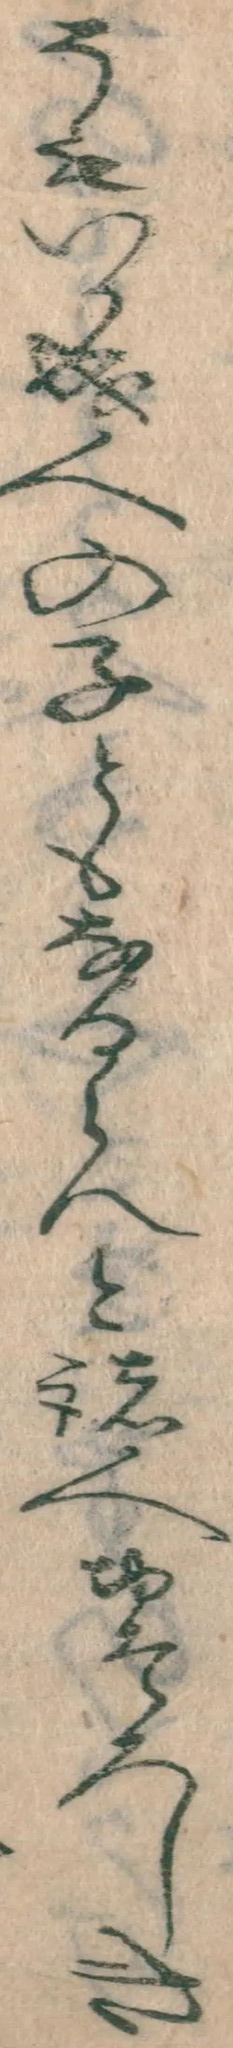そもいか成人の子ともなるらんと諸人おそろしき
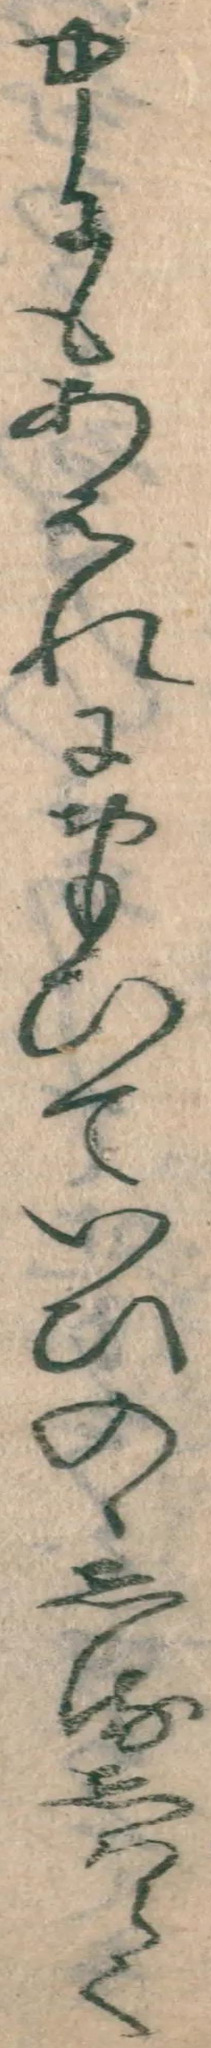申にもあはれにおもひていひのゝしるしばらく
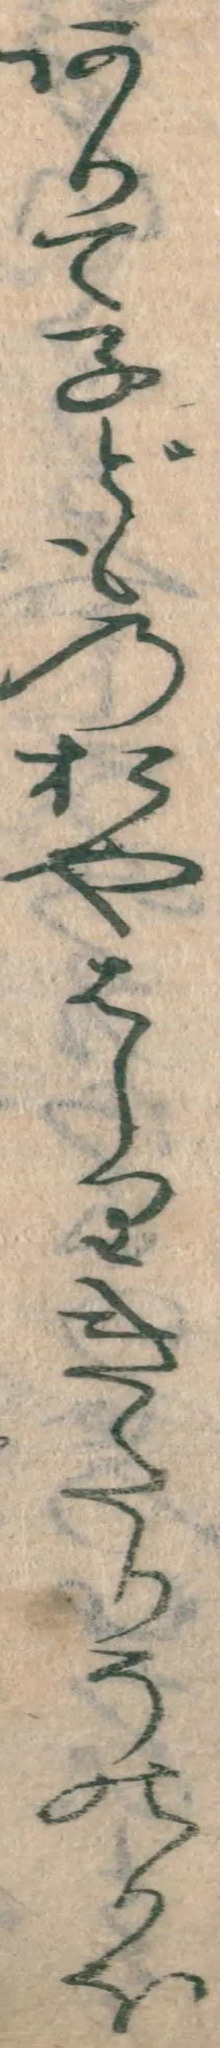ありて子どものおやはしりきたりそのかほ
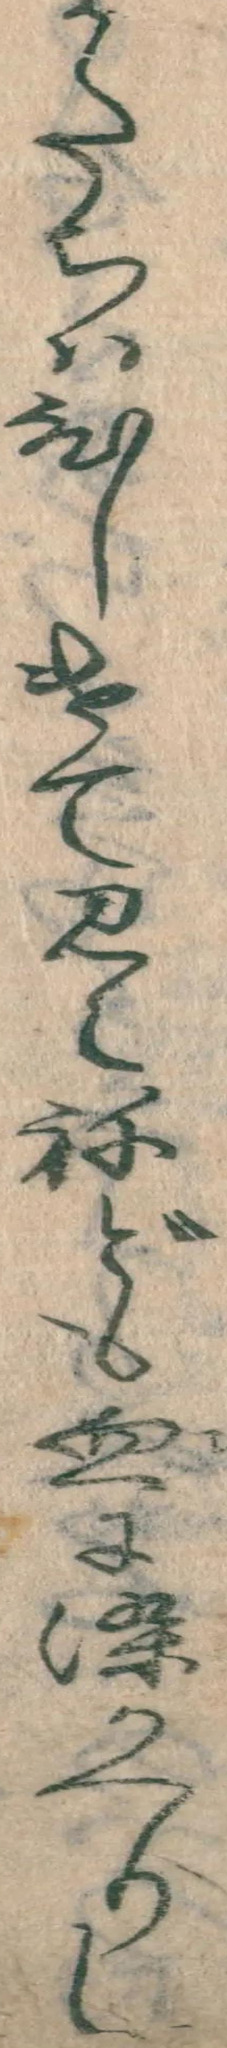かたちはひしけて見えねども血に染かへりし
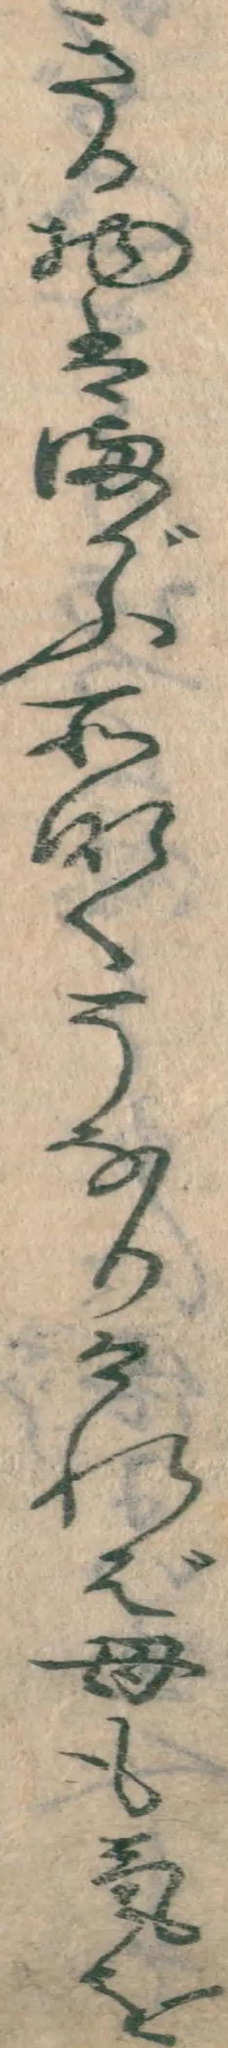きる物はまがふ所なくそなりければ母も気を
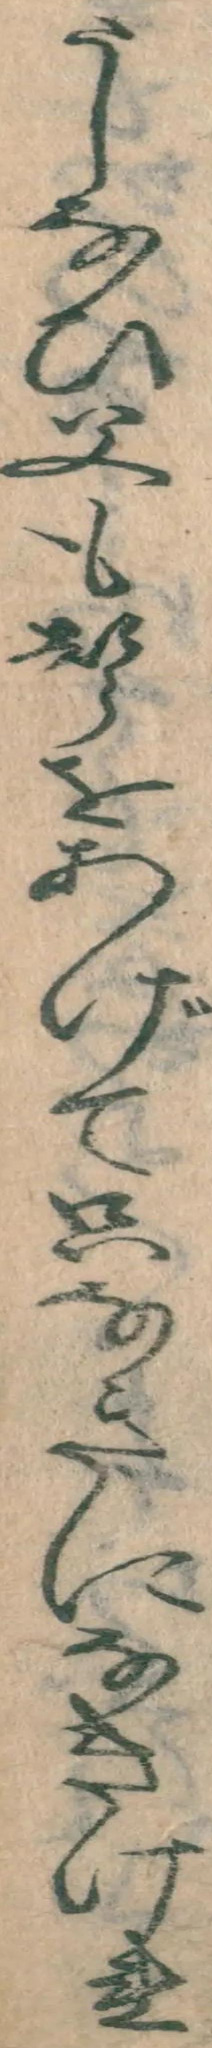うしなひ父も聲をあげて只なきになきけれ

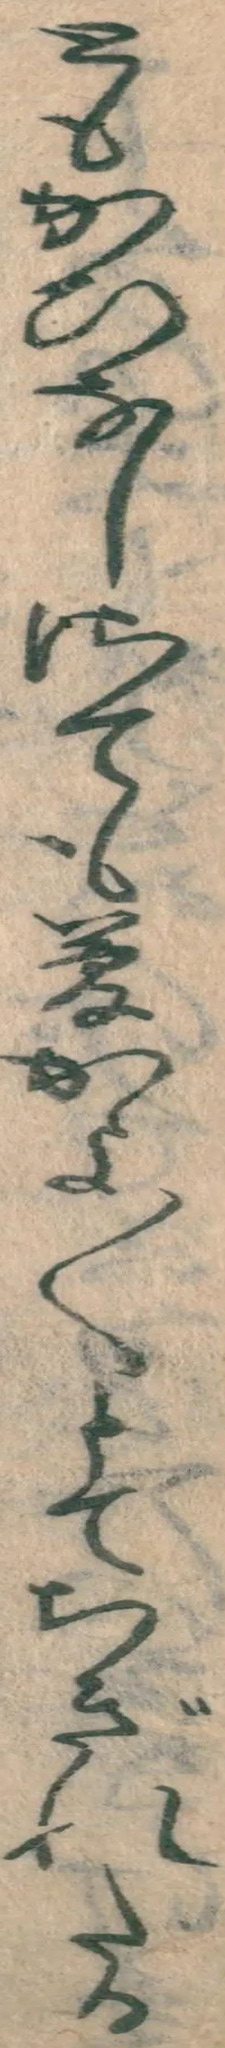ともかひなしさても爰かよ〳〵にてちぎれたる
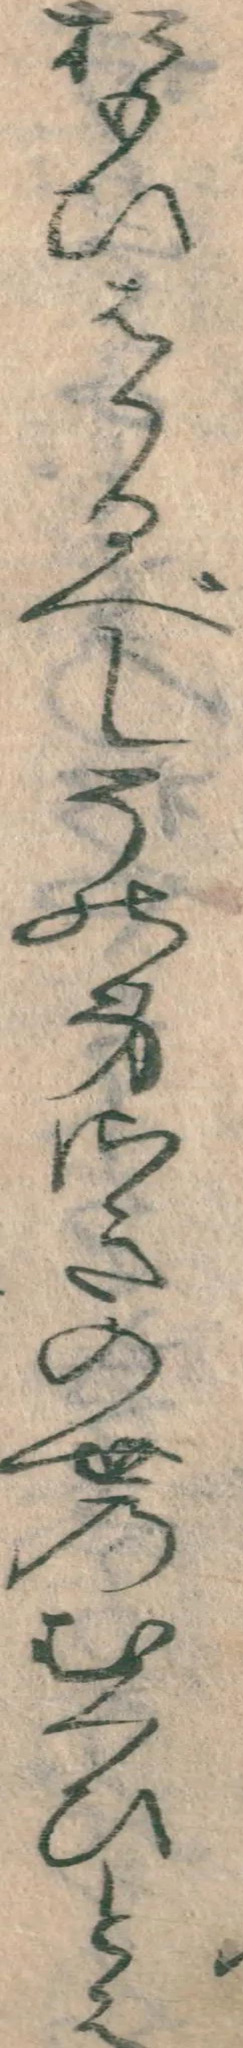おもひはかるべしその身さきの世のむくひとは
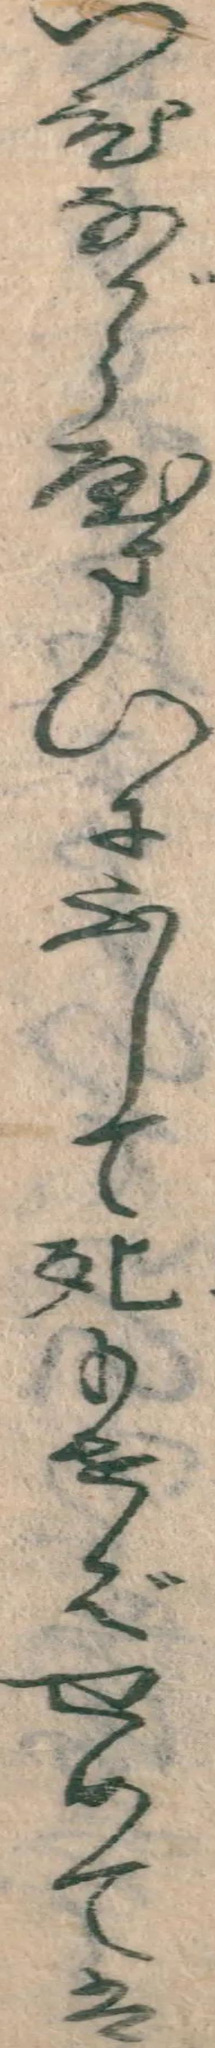いひながらやまいにふして死もせばせめては
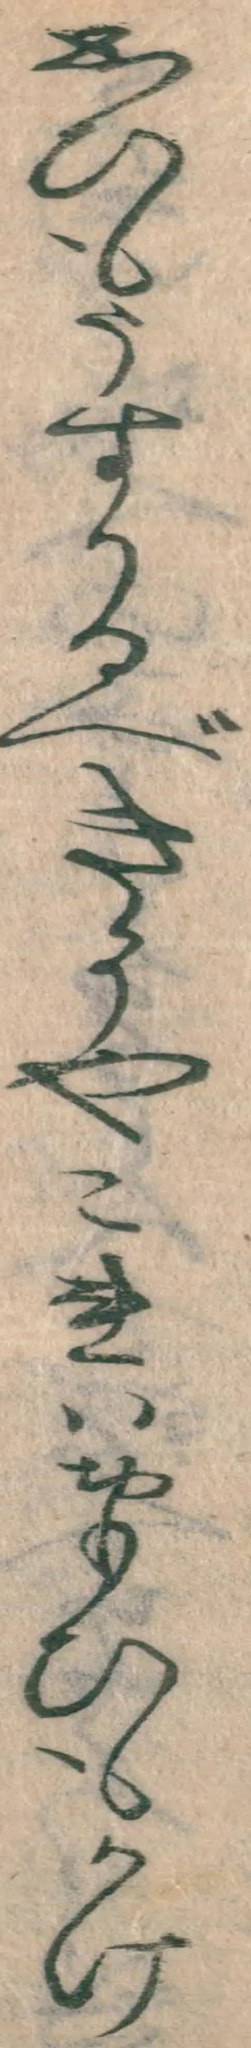思ひもうすかるべきにやこれはおもひもかけ
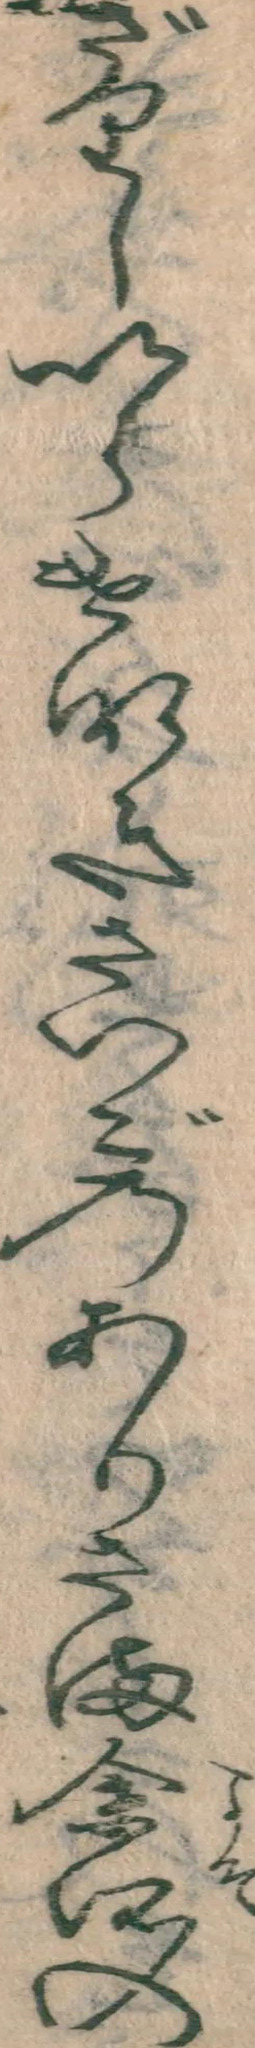ざりしいじけなきさいごのありさま余所の
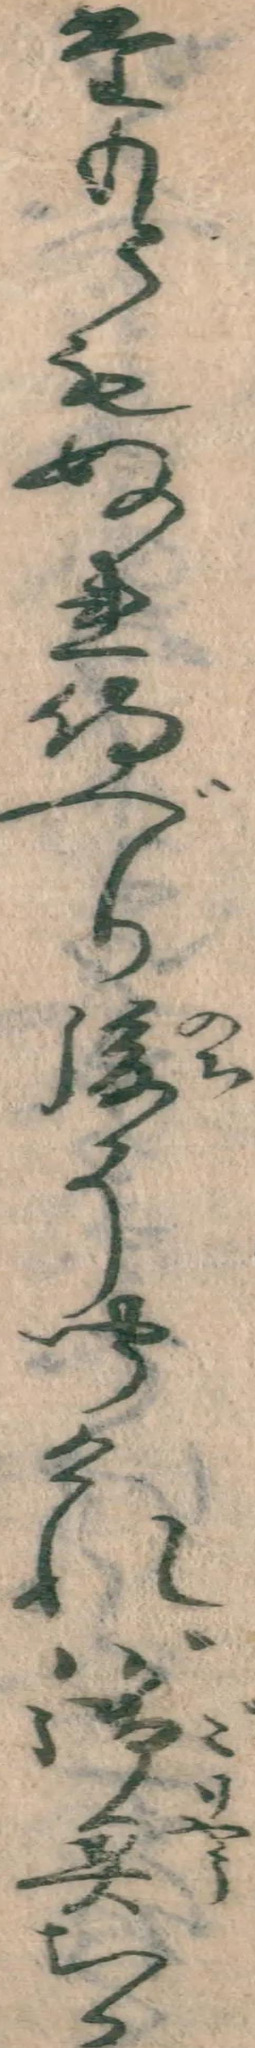たもともぬれ侍べり後に聞ければ御灵ちか
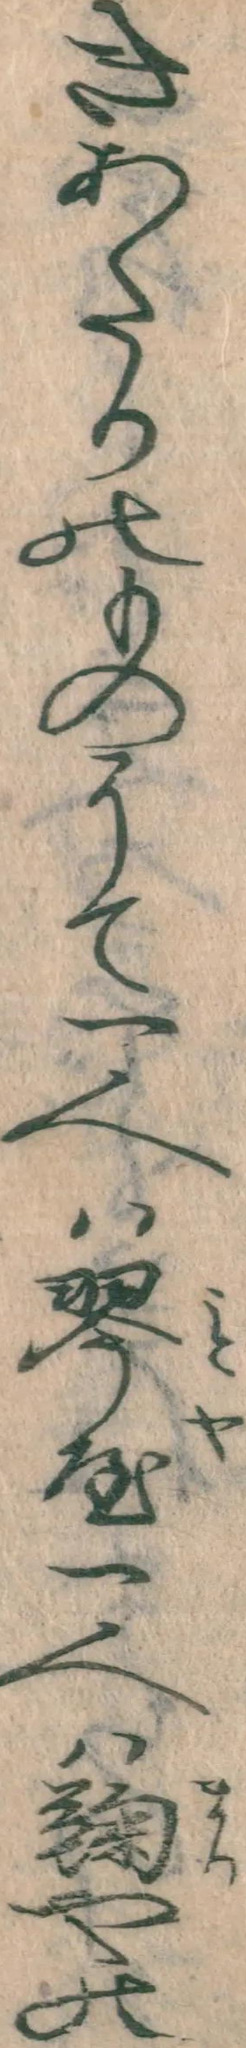きあたりのものにて一人は琴屋一人は鞠やの
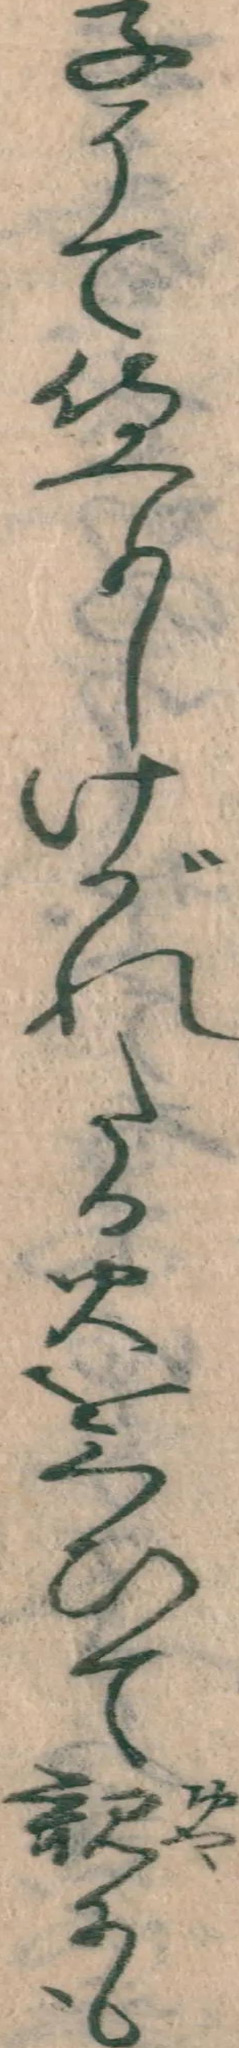子にて侍へりしけがれたる火をくひて親にも
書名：艱難目異志. 上,下
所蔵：国立国会図書館 National Diet Library, JAPAN
